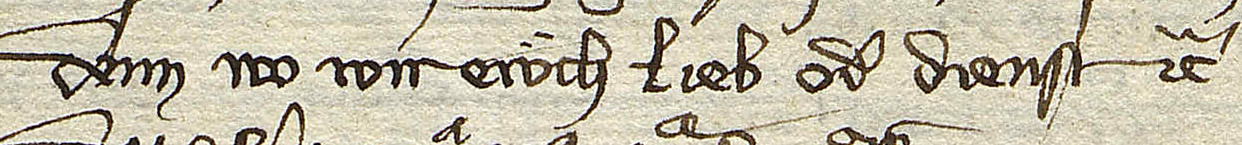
Denn wo wir eẅch lieb od* dienſt ec*
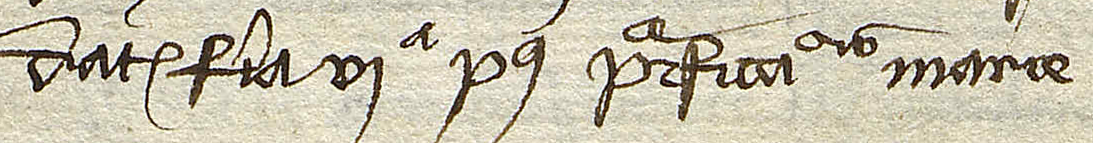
Dat* f*ia vi* p* p*ifica* marie
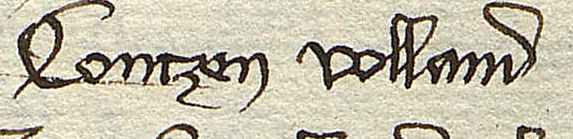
Concʒen volland
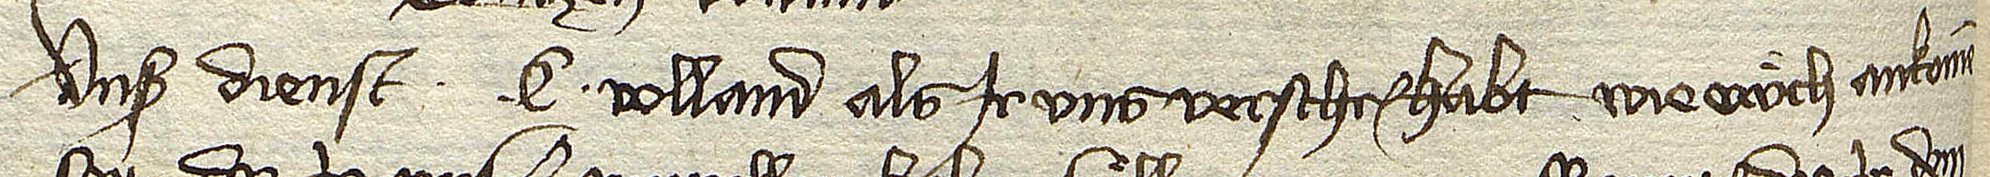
Vnſ* dienſt . C . volland als Ir vns verſchr* habt wie eẅch ankome*
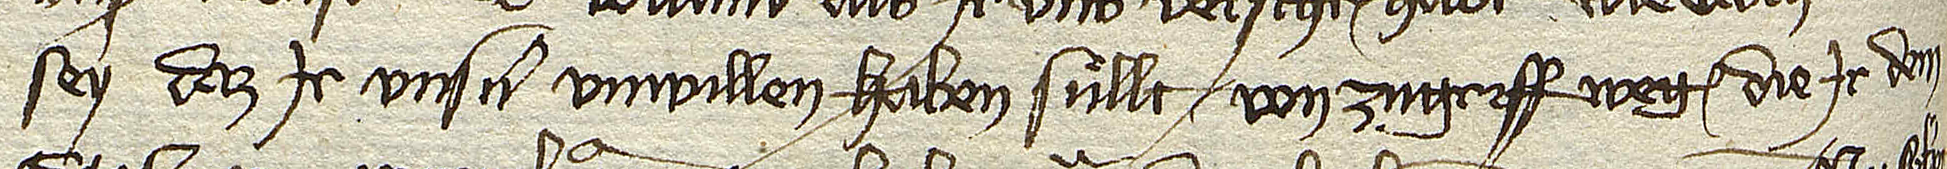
ſey daʒ Ir vnſ*n vnwillen haben ſüllt* von ʒugriff weg* die Ir dem
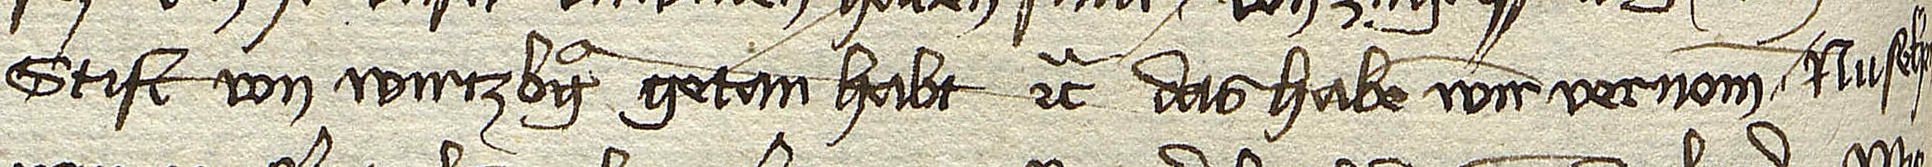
Stift von wircʒb*g getan habt ec* das habe* wir vernom* . Nu ſehen
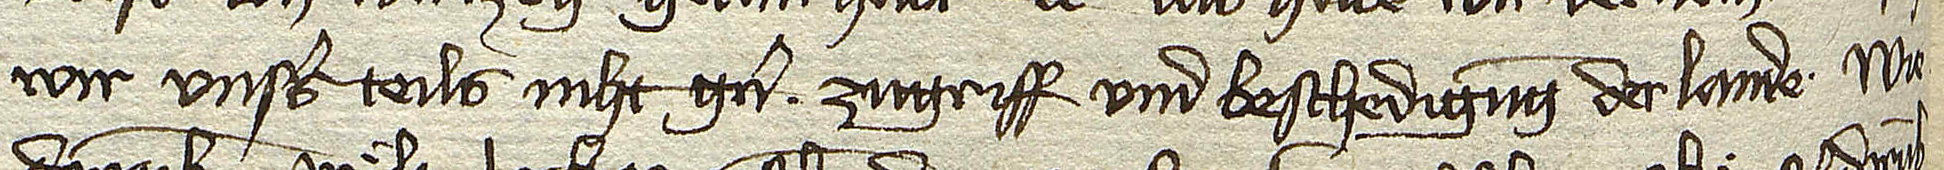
wir vnſ*s teils niht g*n . ʒugriff vnd beſchedigu*g der lande . Wie
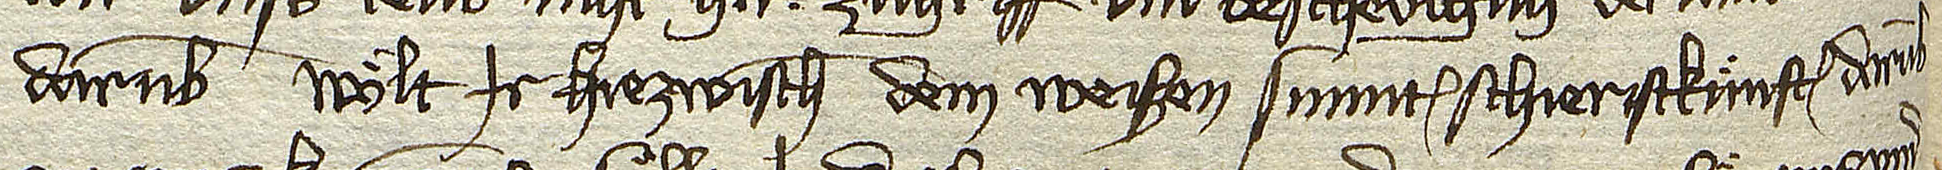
darub* wölt Ir hieʒwiſch* dem weiſ*en ſunnt* ſchieriſtkünft* darub*
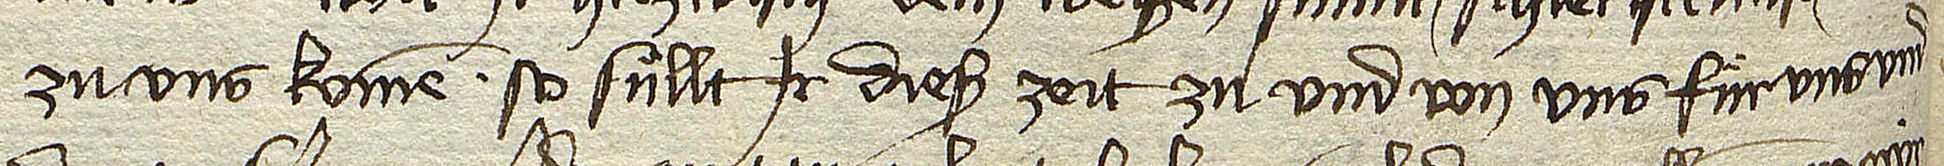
ʒu vns kome* . ſo ſüllt Ir dieſ* ʒeit ʒu vnd von vns für vns vnd
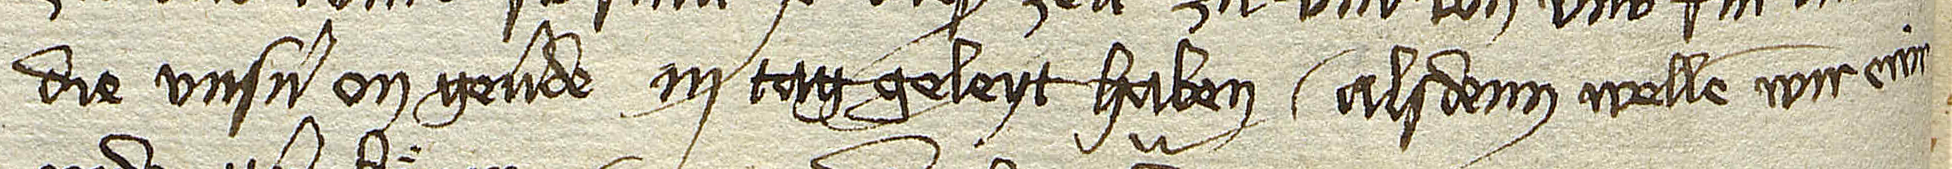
die vnſ*n on geu*de iii tag geleyt haben / alſdenn welle* wir eẅr
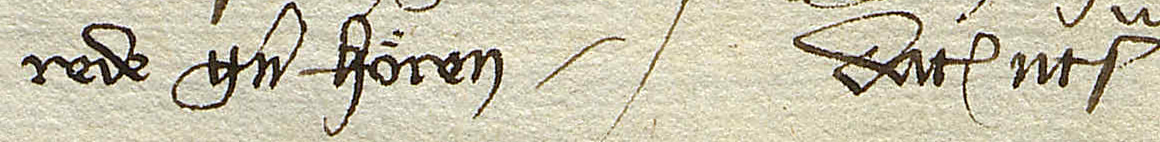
rede g*n hören / Dat* ut ſ*
